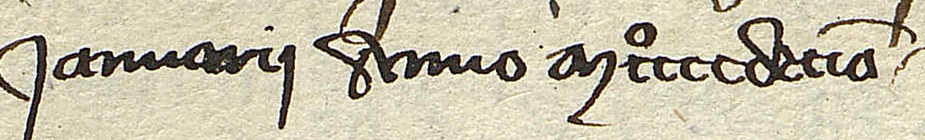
Ianuarii Anno M*ccccdeci*o /
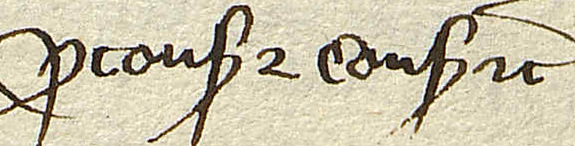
P*conſ* @ Conſ* ec*
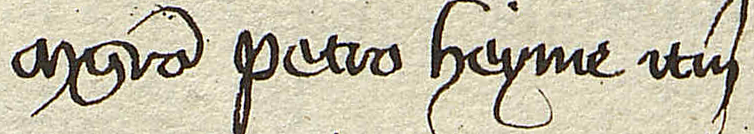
M*g*ro Petro Heyme it*m
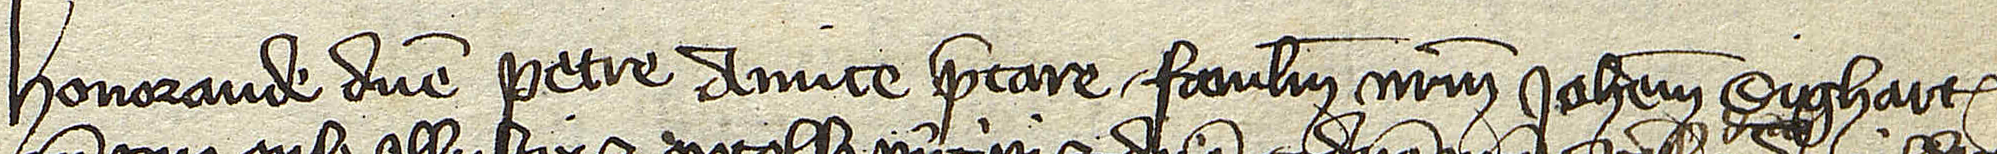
Honorande d*ne Petre Amice p*care fam*l*m n*r*m Ioh*em Sighart*
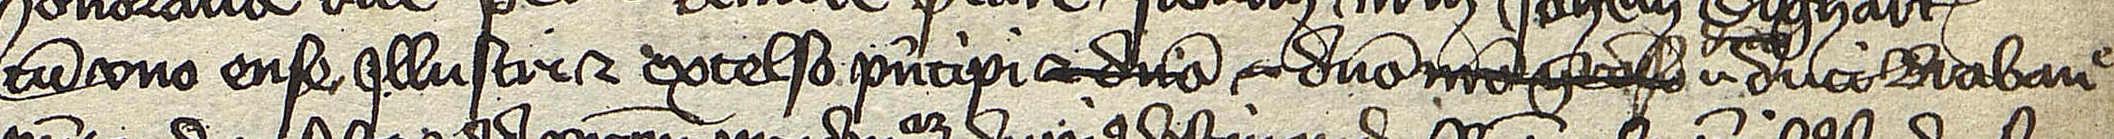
cu* vno enſe Illuſtri @ excelſo p*ncipi @ dno ~ domi* nro* groſi* ~ duci Braban*
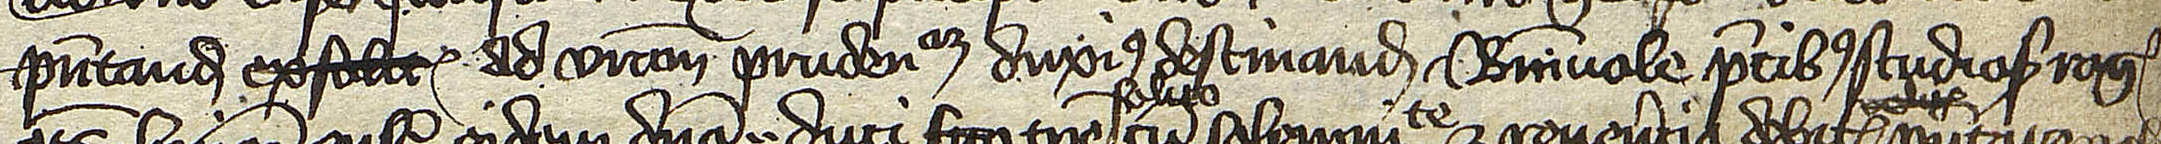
p*ntand* exſol%% Ad v*ram pruden* duxi* deſtinand* / Bn*iuole p*cib* *ſtudioſ* rog*
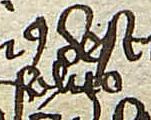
solito
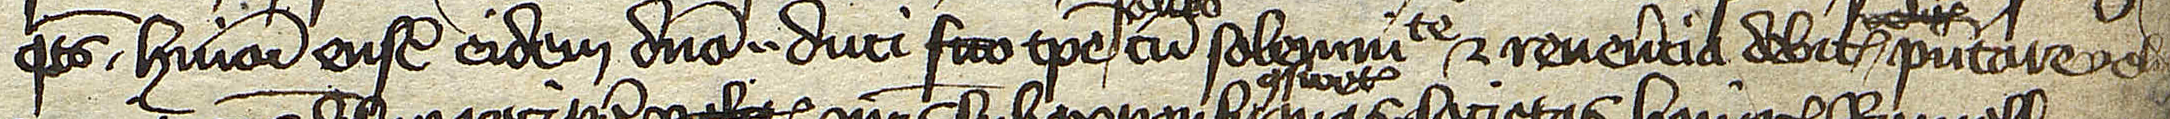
q*t*s / hui*o*i enſe* eidem domi* ~ duci ſuo t*p*e cu* ſolemni*te @ reue*ntia debit* putare vel*
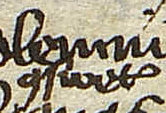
*ſuet*
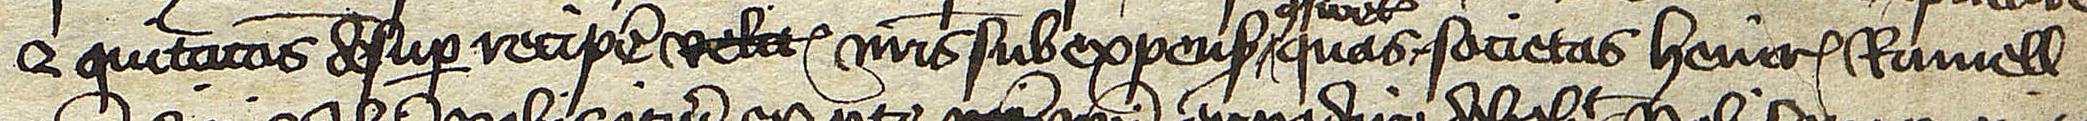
@ quitac*o*s deſup* recipe* velct* n*ris ſub expenſ* quas ſocietas Heinr* Rumell
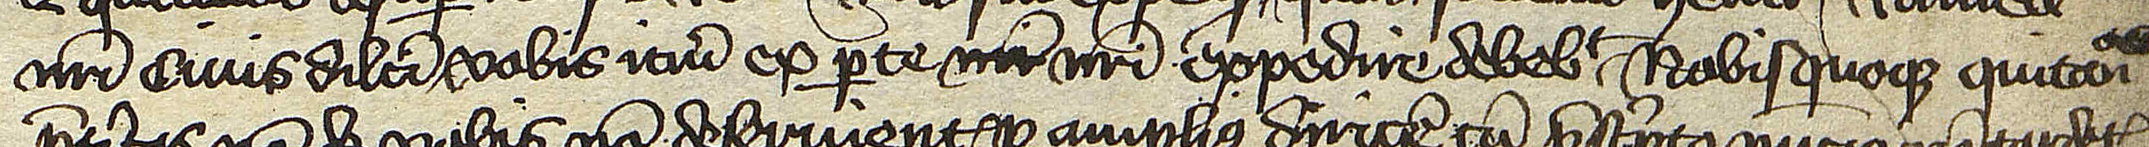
n*ri Ciuis dil*ti vobis it*m ex p*te nri* n*ri expedire debeb* / Nobis quoq* quita*
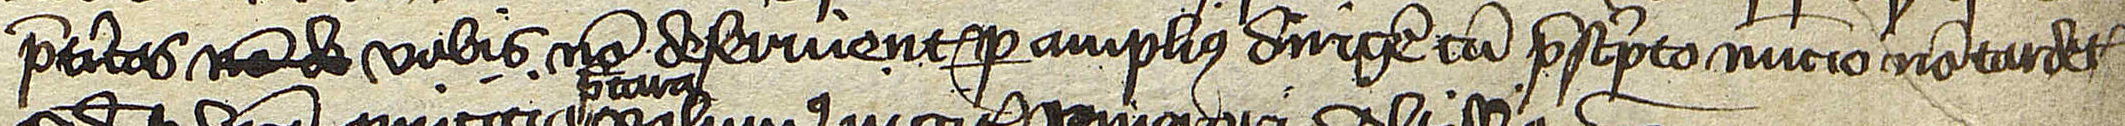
p*t*itas no* de vobis no* deſervient* p* ampli* dirige* cu* p*ſc*pto nu*cio no* tardet*
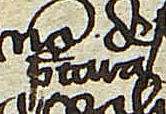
p*cara
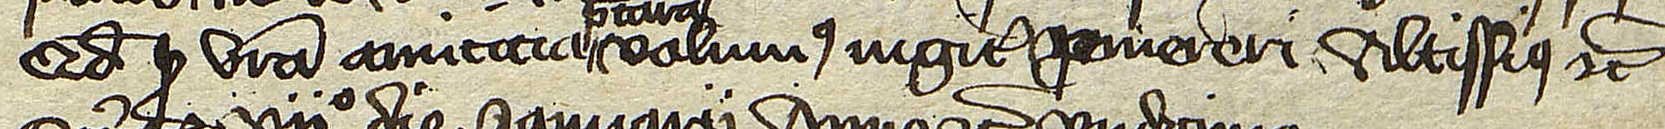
o*d* p* v*ra amicitia volum* Iugit* p*mereri / Altissi* ec*
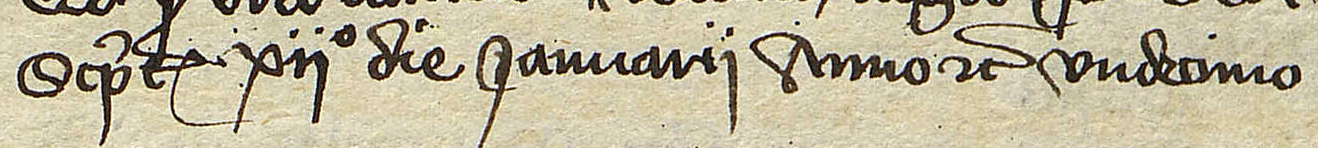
Sc*pt* xii* die Ianuarii Anno ec* vndecimo
